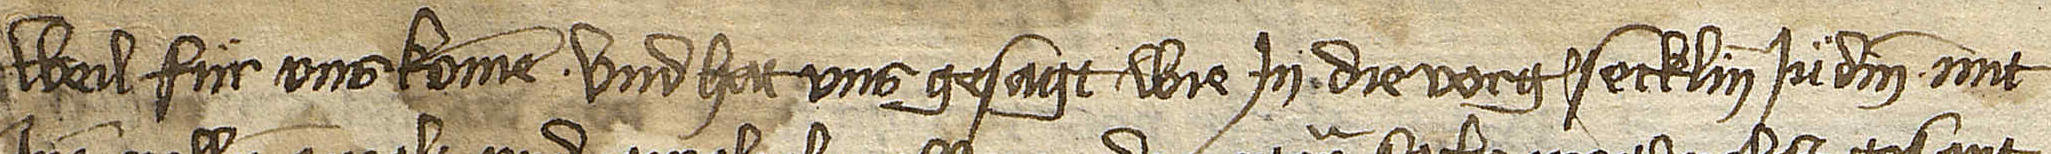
weil für vns kome* . vnd hat vns geſagt / wie In die vorg* ſecklin Iüdin* mit
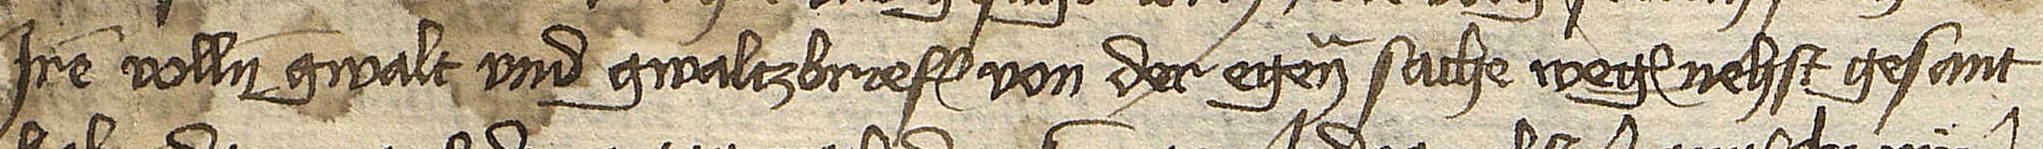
Ire* volln* gwalt vnd gwalcʒbrief* von der egen* ſache weg* nehſt geſant
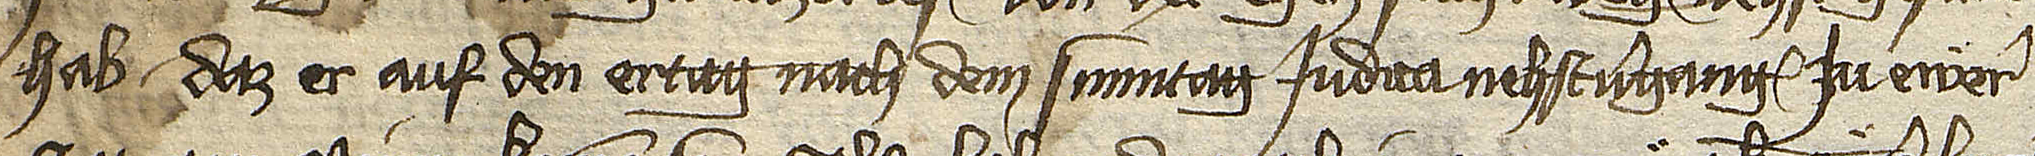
hab / daʒ er auf den ertag nach dem ſunntag Iudica nehſtu*gang* In ewer*
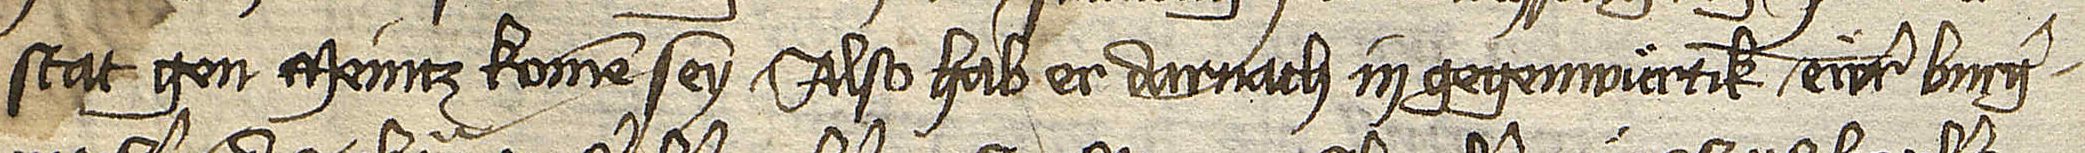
ſtat gen Meincʒ kome* ſey / Alſo hab er darnach in gegenwürtik* / ewr* burg* -
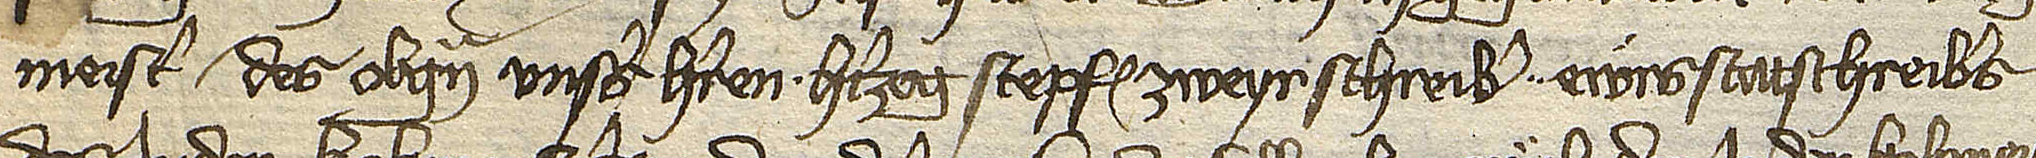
meiſt* / des obgn* vnſ*s hr*en . h*cʒog ſtepf* ʒweyr ſchreib* ewrs ſtatſchreib*s
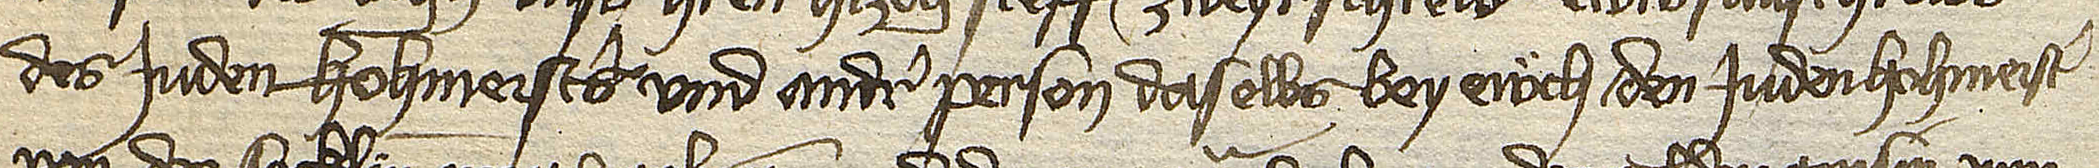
des Iuden Hohmeiſ*s vnd andr* perſon daſelbs bey ewch / den Iuden hohmeiſt*
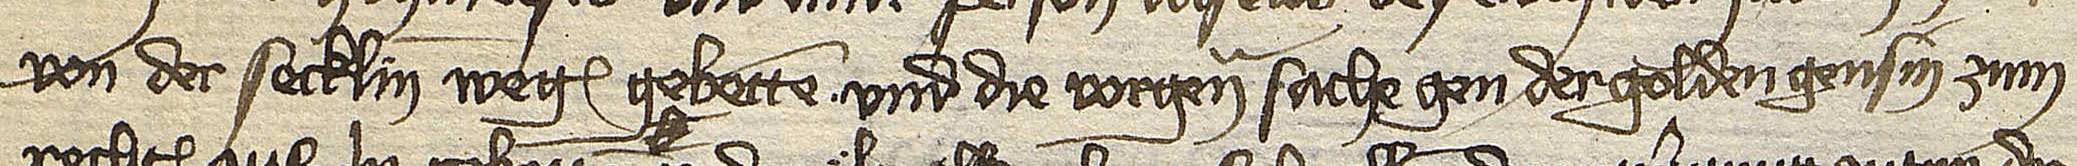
von der ſecklin* weg* gebette* . vnd die vorgen* ſache gen der golden genſin ʒum
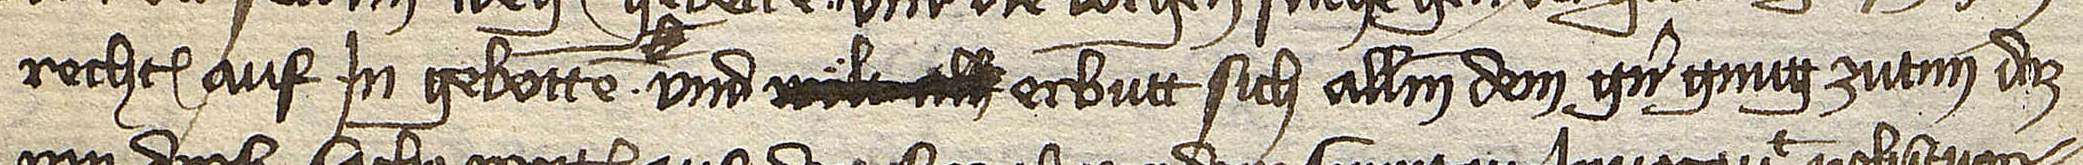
recht* auf In gebotte* . vnd wölt all erbutt ſich allm* dem gn* gnug ʒutun daʒ
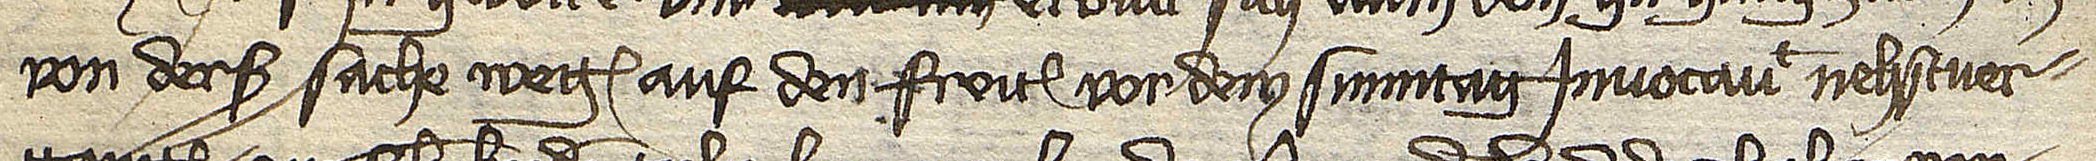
von derſ* ſache weg* auf den freit* vor dem ſunntag Inuocau* nehſtuer =
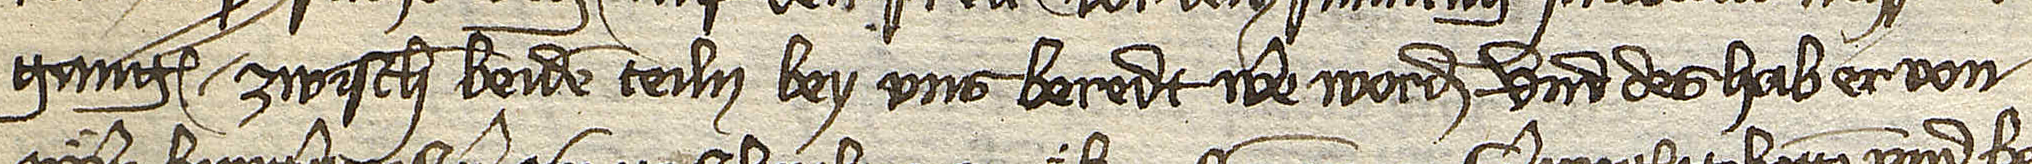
gang* / ʒwiſch* beide* teiln bey vns beredt w*e word* Vnd des hab er von
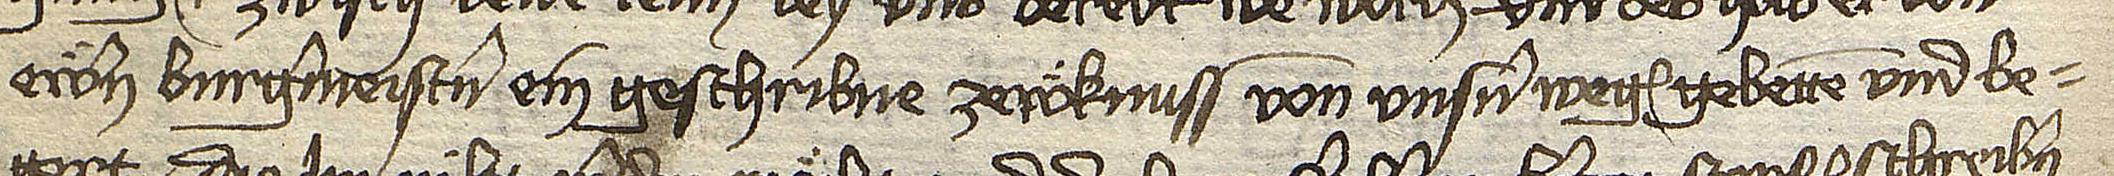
ew*n burg*meiſtn* ein geſchribne ʒewknuſſ von vnſn* weg* gebette* vnd be =
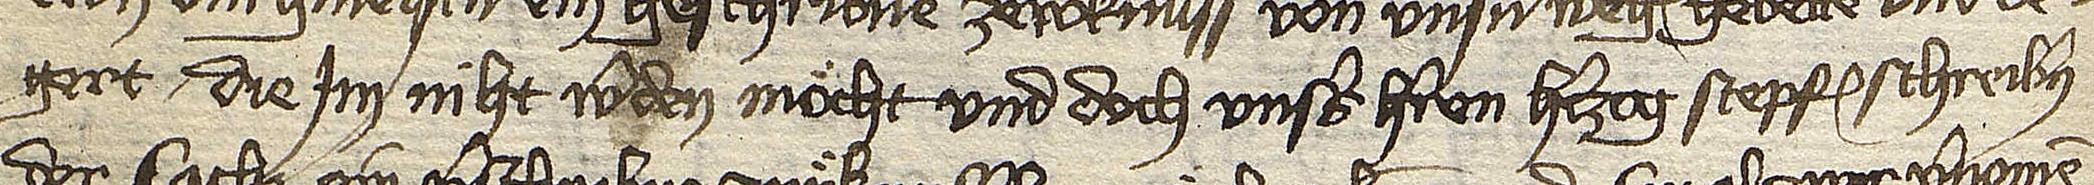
gert / die Im niht w*den möcht vnd doch vnſ*s hr*en h*cʒog ſtepf* ſchreib*n
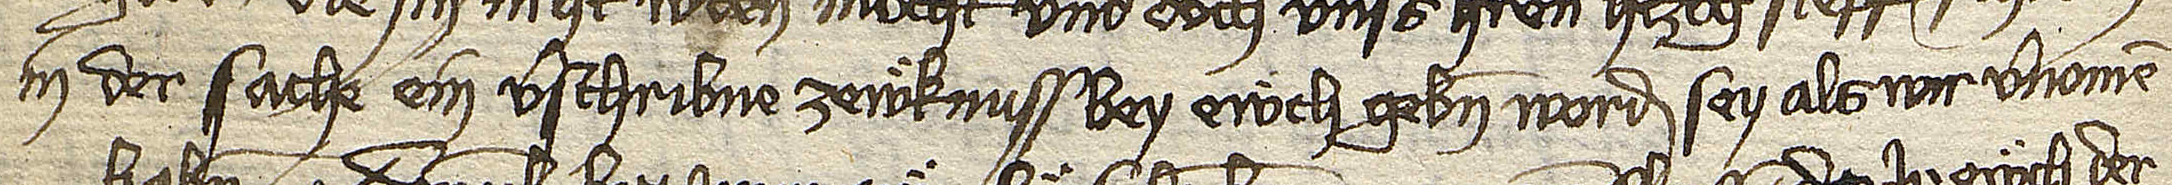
in der ſache ein v*ſchribne ʒewknuſſ bey ewch gebn* word* ſey als wir v*nome*
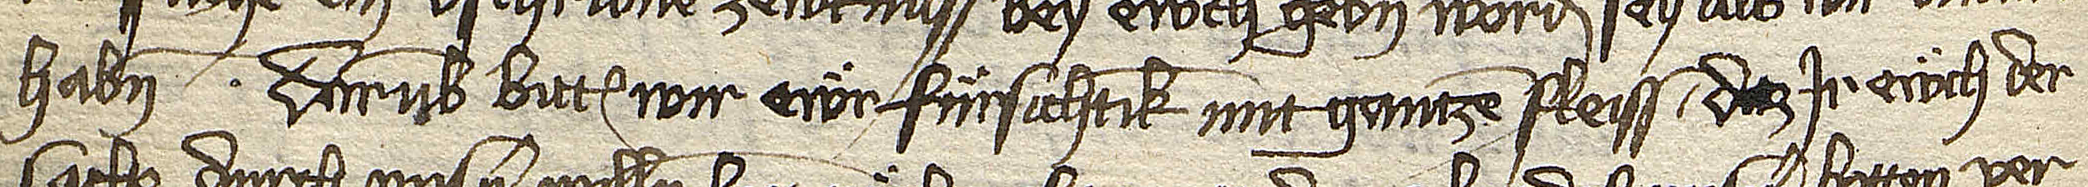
habn* / Daru*b bitt* wir ewr fürſichtik* mit gancʒe* fleiſſ / daʒ Ir ewch der
